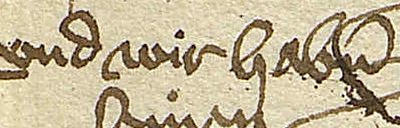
vnd wir habn*
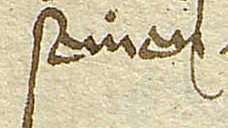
ſeinen
